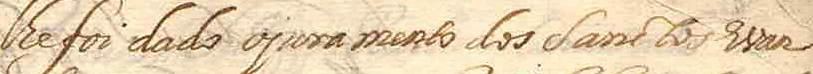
lhe foi dado o juramento dos Sanctos Evan
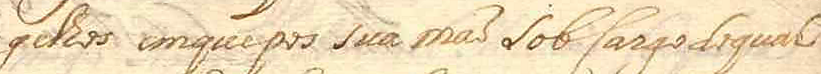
gelhos em que pos sua maõ sob Cargo do qual
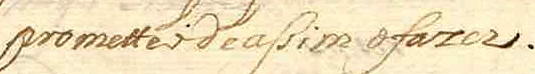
prometteo de assim o fazer.
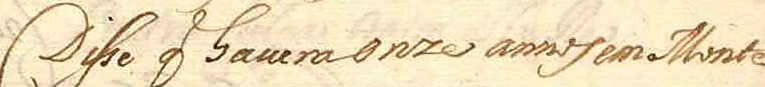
Disse q̄ hauera onze annos em Monte
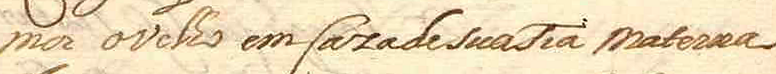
mor o velho em Caza de sua Tia materna
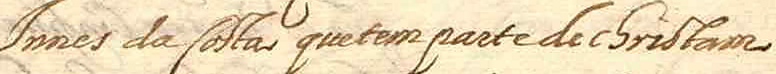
Jnnes da Costa que tem parte de christam
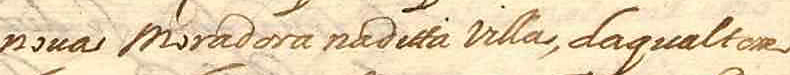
noua moradora na ditta villa, da qual tem
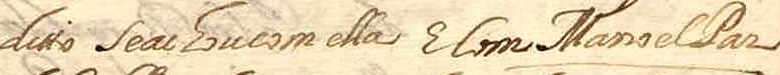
ditto se achou com ella E Com Manoel Par
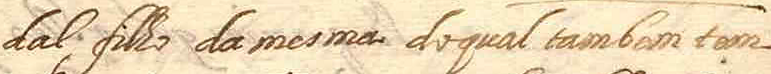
dal filho da mesma do qual tambem tem
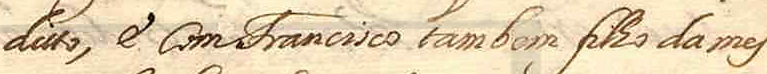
ditto, e com Francisco tambem filho da mes
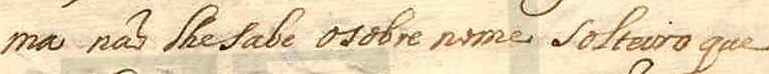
ma naõ lhe sabe o sobre nome solteiro que
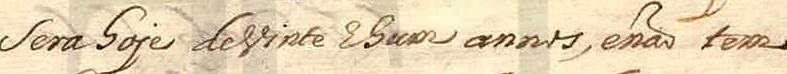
sera hoje de vinte E hum annos, e naõ tem
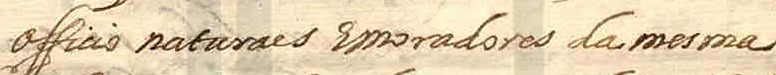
officio naturaes E moradores da mesma
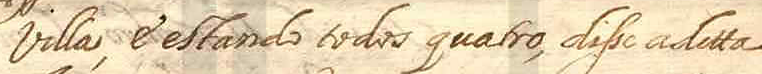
Villa, e estando todos quatro, disse a ditta
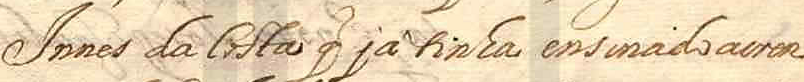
Jnnes da Costa q̄ já tinha ensinado a cren
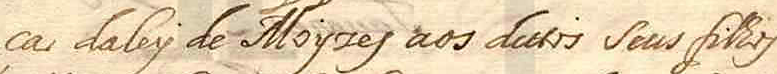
ça da ley de Moyzes aos dittos seus filhos
